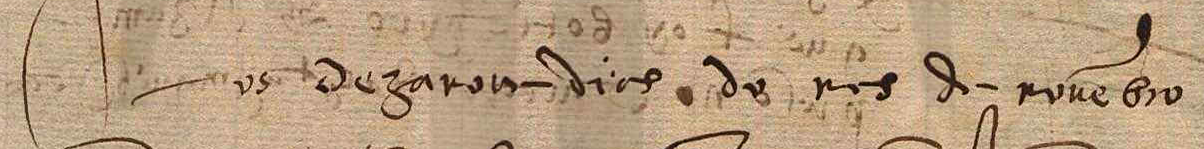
Aos dezanoue dias do mes de nouēbro
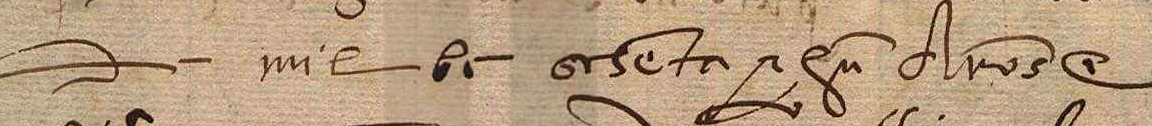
de miL bc sesēta e hū An̄os ē
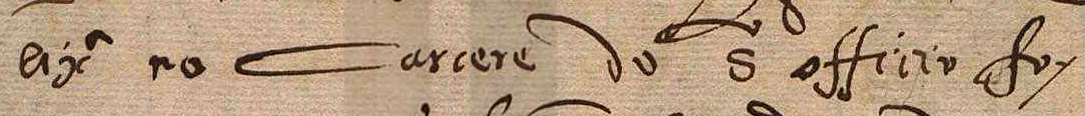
lixa no Carcere do Sto officio foy
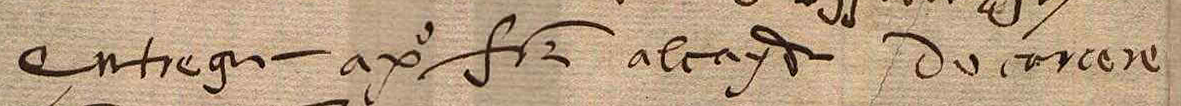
entregue a po frz̄ alcayde do carcere
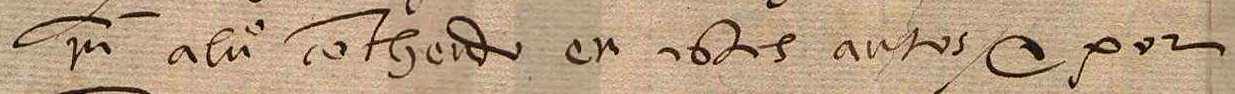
mte aluo cōtheudo em estes autos / e por
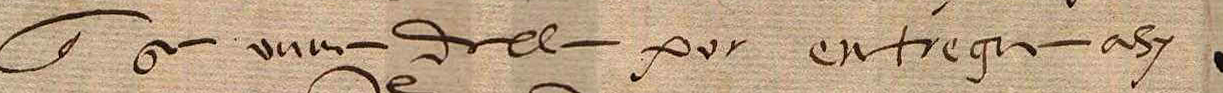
q̄ se ouue delle por entregue asy
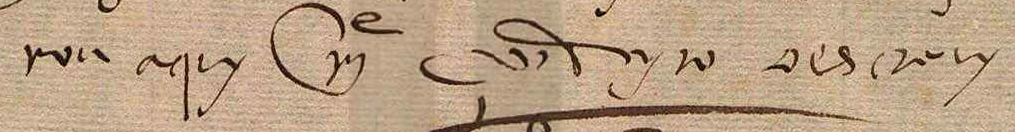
nou aquy mel Cordeyro o escreuy
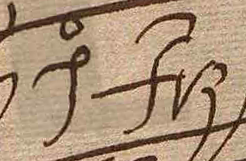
Po f̄rz
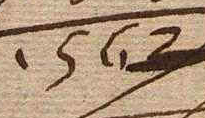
1562
